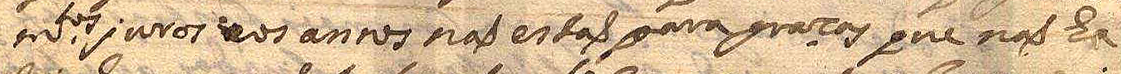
m.tos juros aos annos naõ estaõ para graças que naõ ha
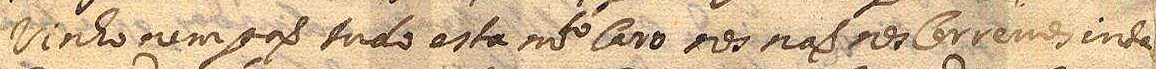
vinho nem paõ tudo esta mto caro nos naõ nos Corremos inda
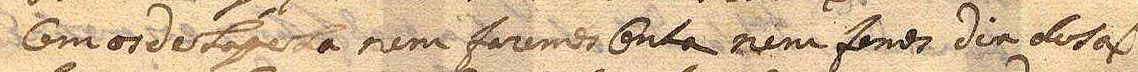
Com os de LapeLa nem fazemos Conta nem fomos dia de saõ
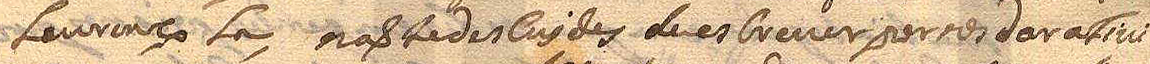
Lourenço La, naõ te descujdes de escreuer por nos dar aliui
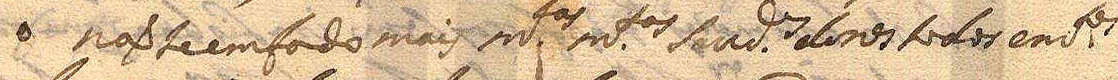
o naõ te emfado mais m.tas m.tas saud.es de nos todos e m.tos
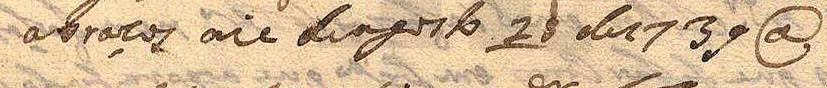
abraços oie de agosto 28 de 1739 ā
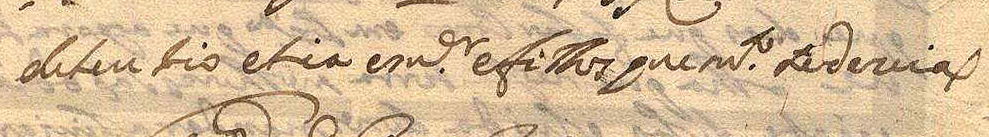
de teu tio e tia e m.er e filhos que m.to te dezeiaꝭ
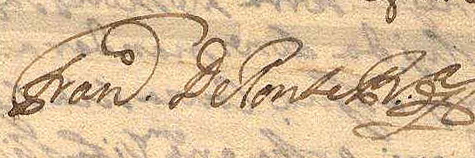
Fran.co De Ponte Pr.a
